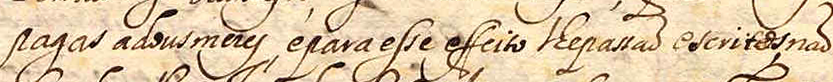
pagas a dous mezes, e para esse effeito lhe passaõ escritos naõ
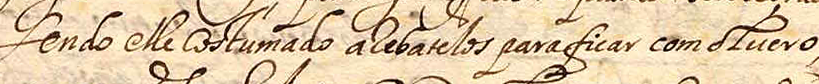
sendo elle costumado a Rebatelos para ficar com o Lucro,
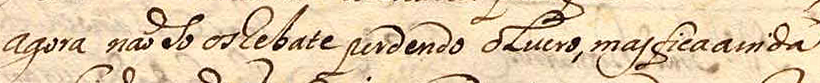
agora naõ so os Rebate perdendo o Lucro, mas fica ainda
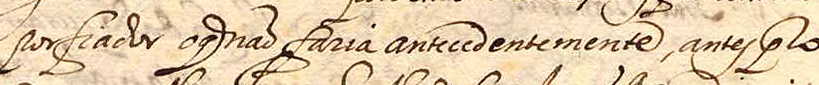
por fiador, o q̄ naõ fazia antecedentemente, antes pro
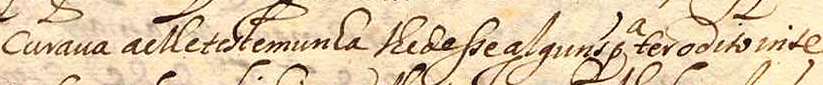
curaua a elle testemunha lhe desse alguns pa ter o dito inte
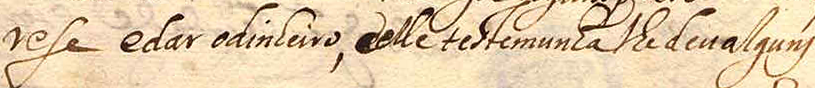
rese e dar o dinheiro, e elle testemunha lhe deu algun̄s
